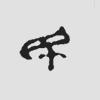民
